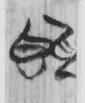既
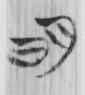明
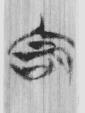命
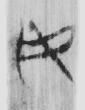女
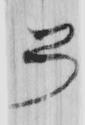乃
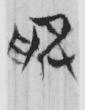服
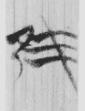隹
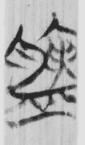{月寅皿}
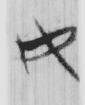女
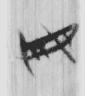母
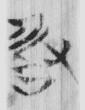敢
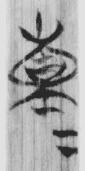{束？}
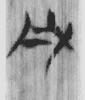凡
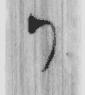人
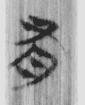有
